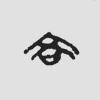吝
